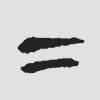二
